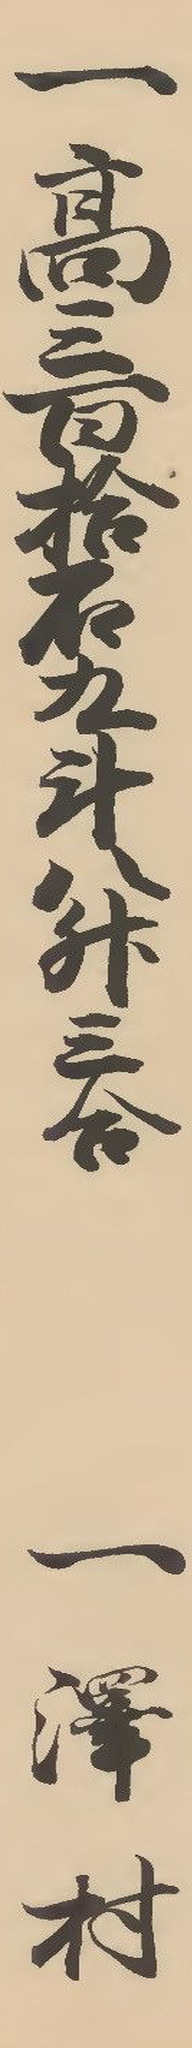一高三百拾石九斗八升三合一沢村
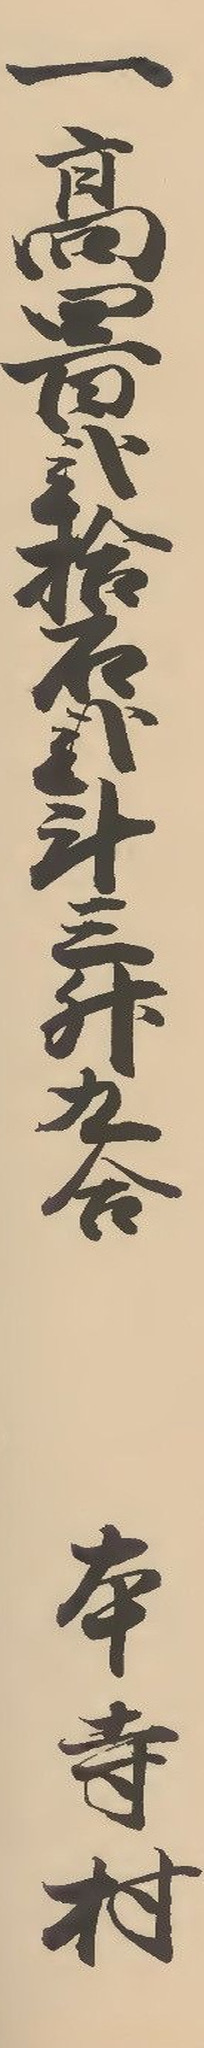一高四百弐拾石弐斗三升九合本寺村
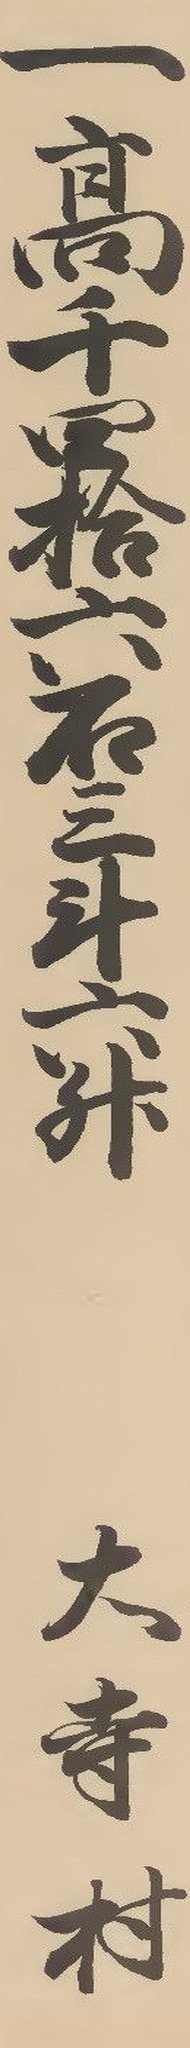一高千四拾六石三斗六升大寺村
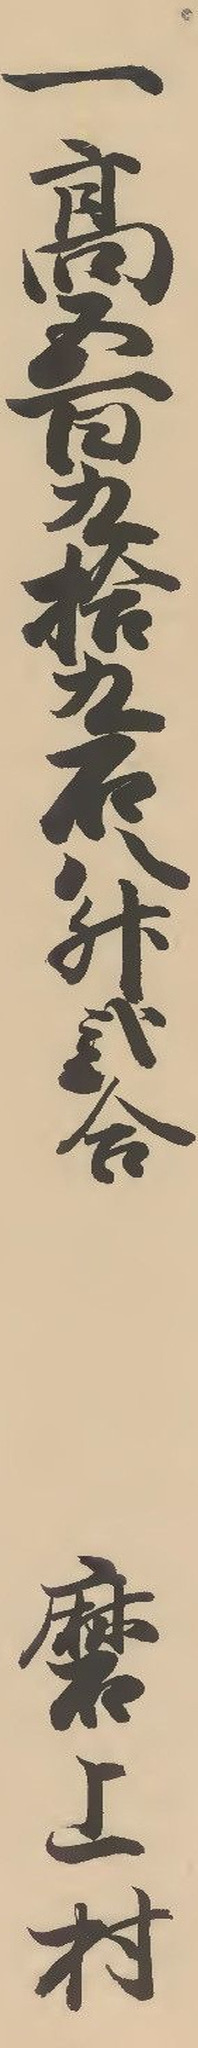一高五百九拾九石八升弐合磨上村
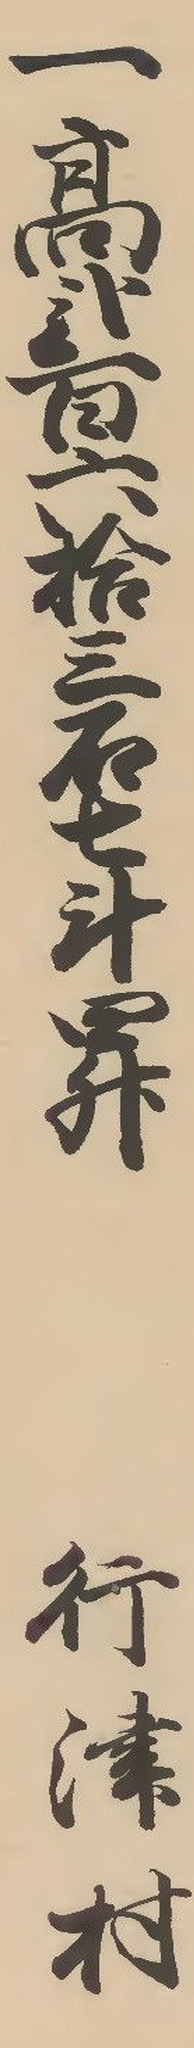一高弐百六拾三石七斗四升行津村

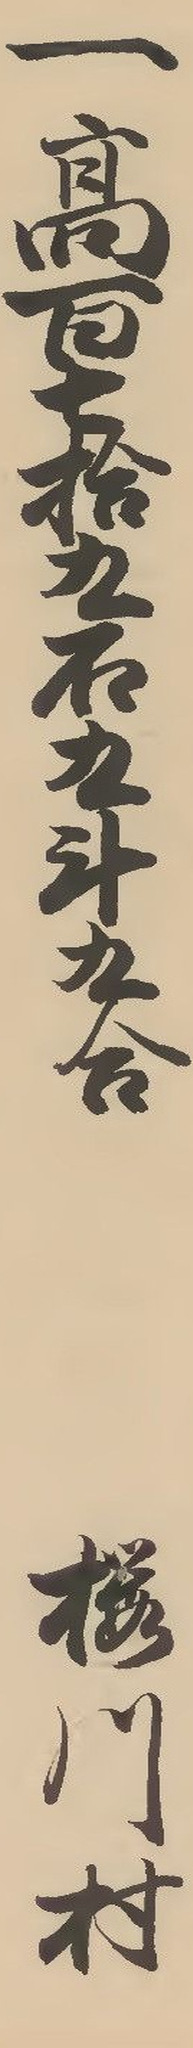一高百七拾九石九斗九合桜川村
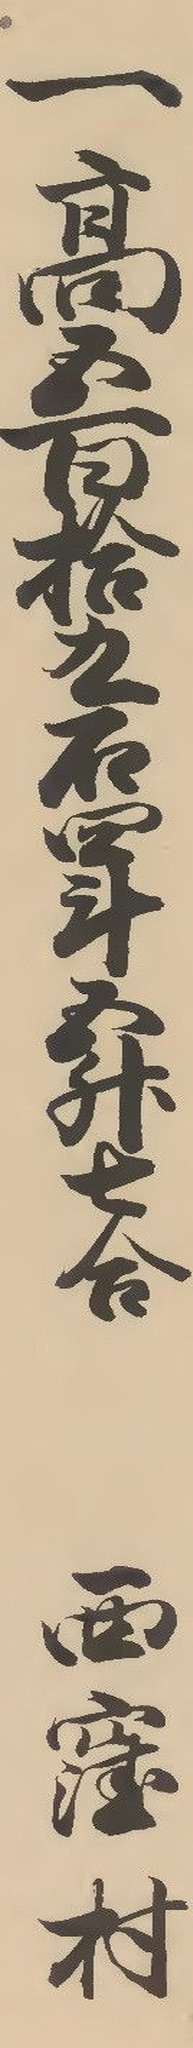一高五百拾九石四斗五升七合西窪村
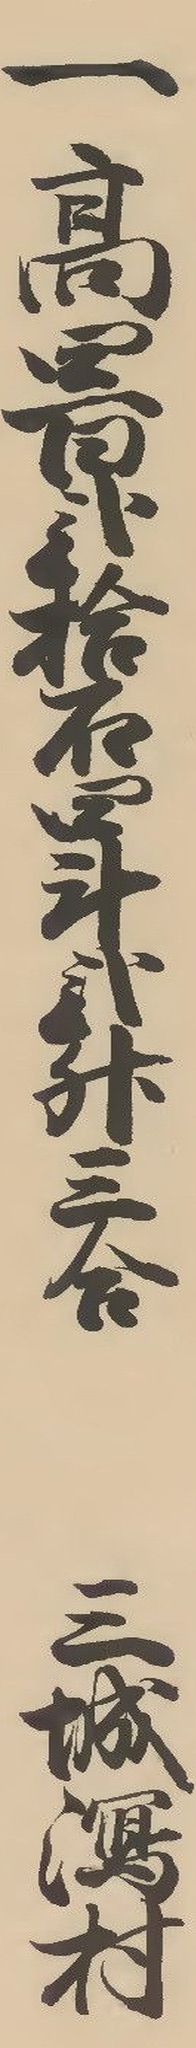一高四百弐拾石四斗弐升三合三城潟村
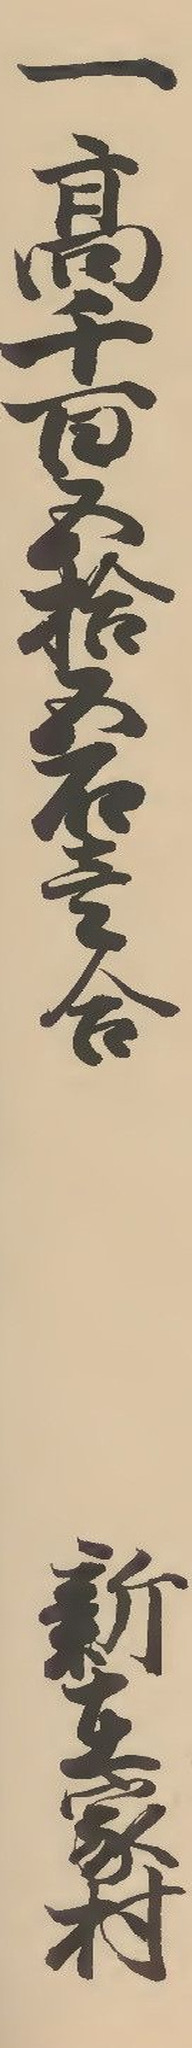一高千百五拾五石壱合新在家村
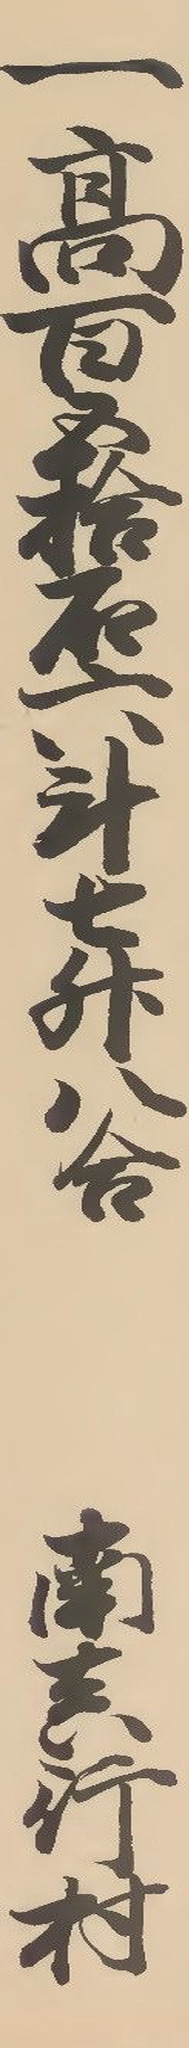一高百五拾石六斗七升八合南真行村
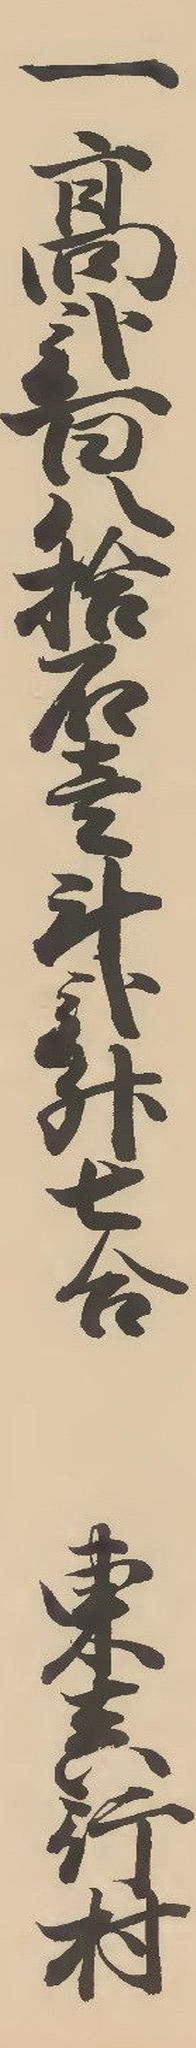一高弐百八拾石壱斗弐升七合東真行村
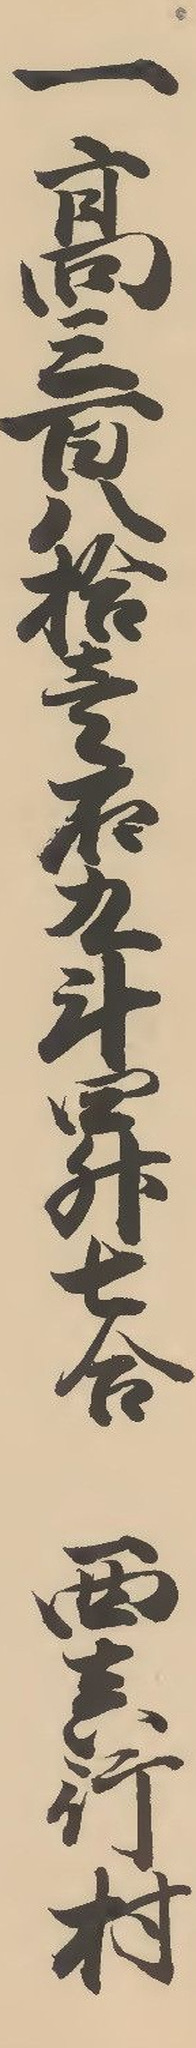一高三百八拾壱石九斗四升七合西真行村
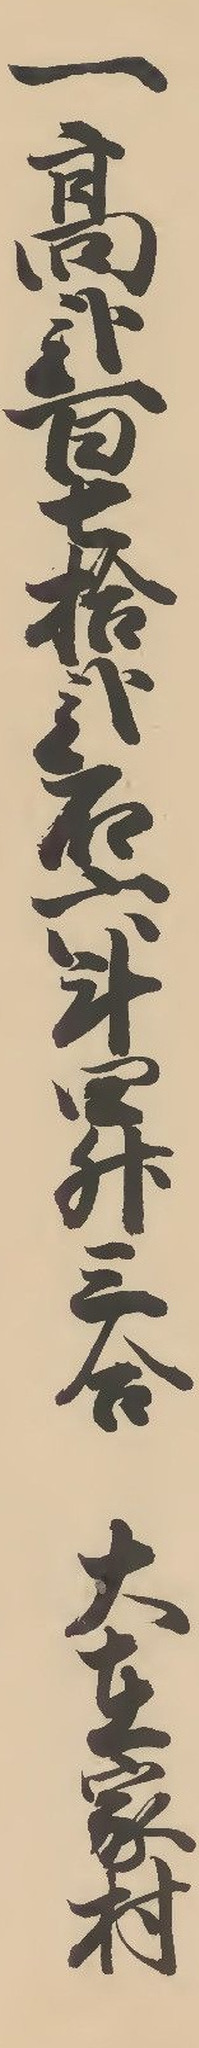一高弐百七拾弐石六斗四升三合大在家村

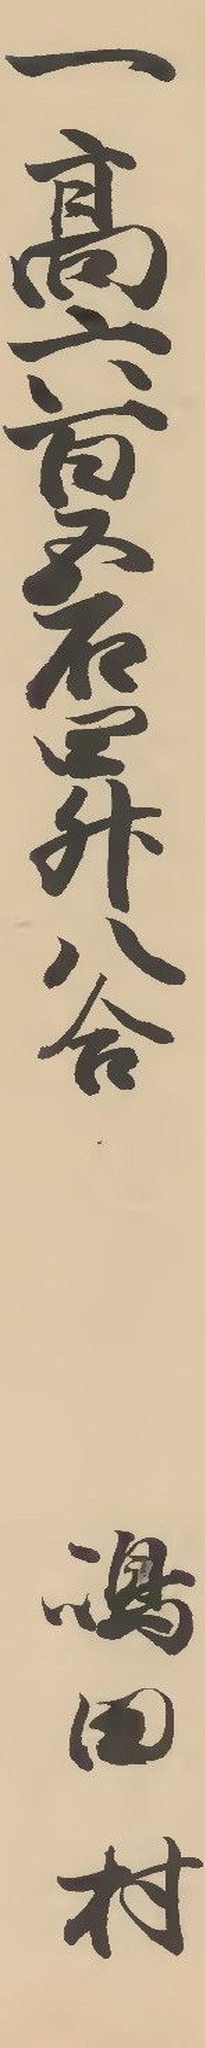一高六百五石四升八合島田村
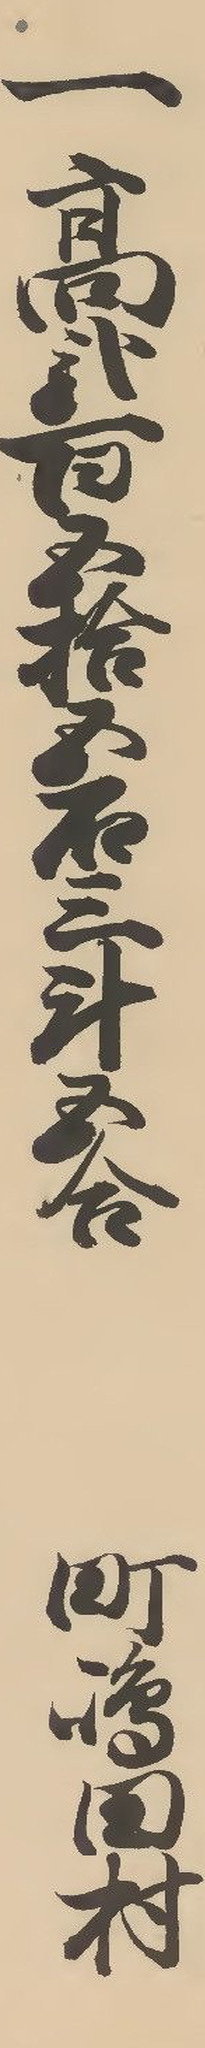一高弐百五拾五石三斗五合町島田村
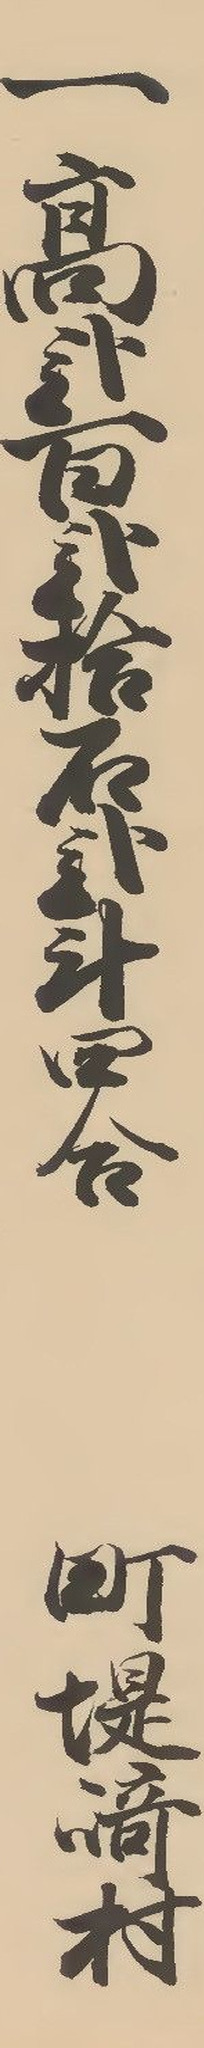一高弐百弐拾石弐斗四合町堤崎村
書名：陸奥国郷帳　１
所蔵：国立公文書館 National Archives of Japan
